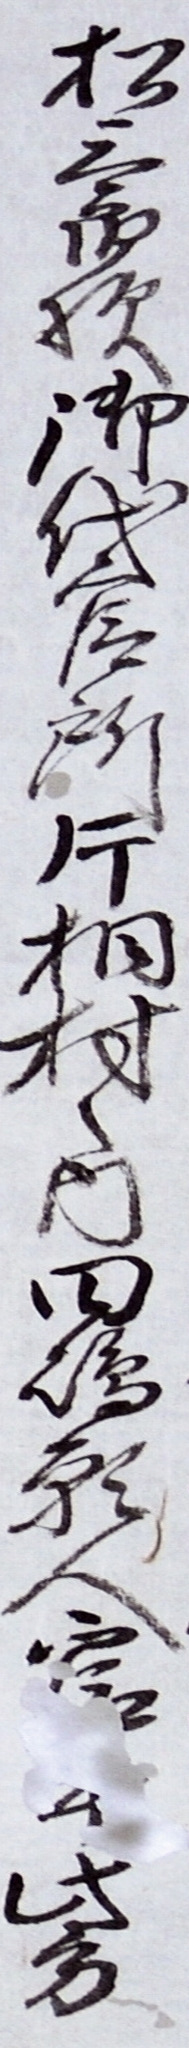松三郎様御代官所片桐村之内田嶋願人此方
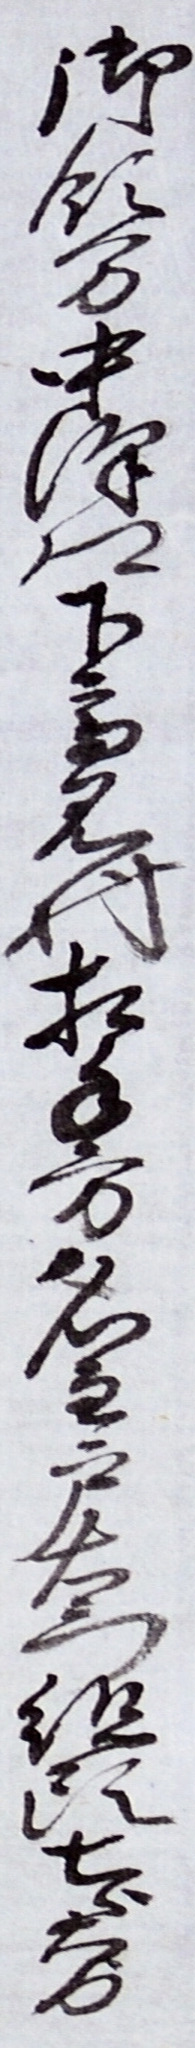御領分中澤郷下高見村相手方名主戸右衛門組頭七郎右衛門
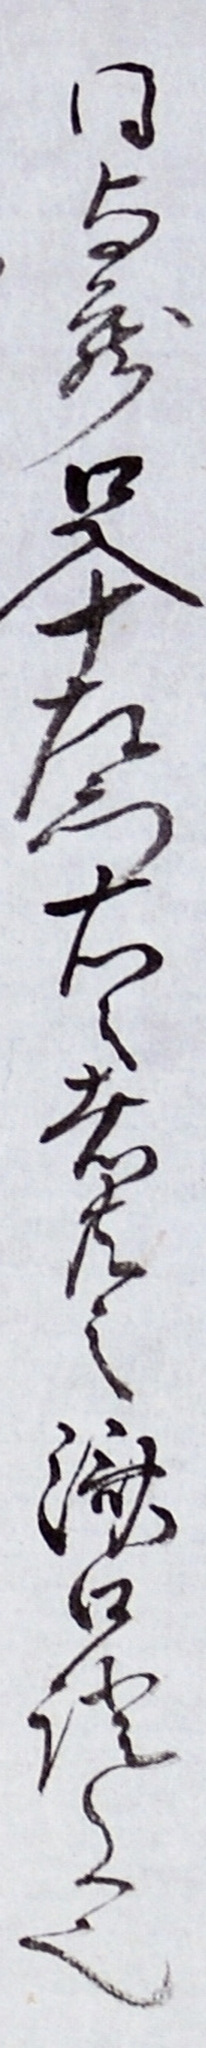同与蔵口入十左衛門右之者共之済口證文也
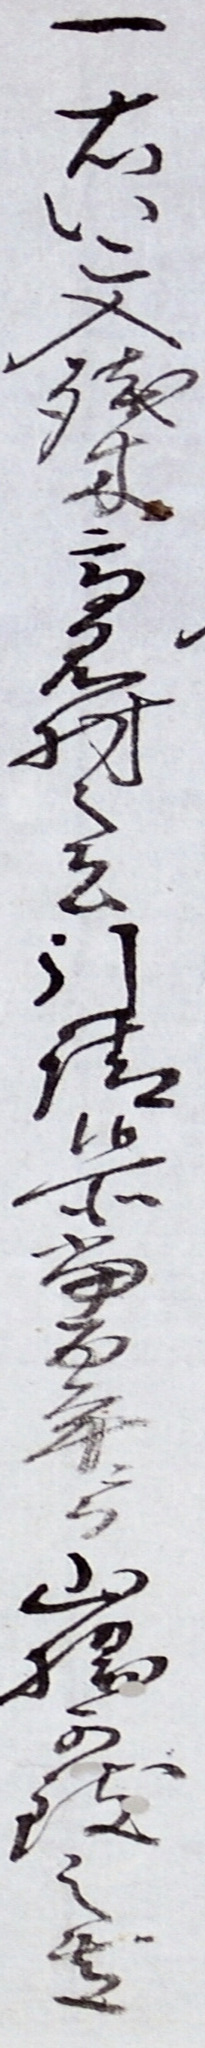一右いこ入残木高見村之者引請候所当酉年ニ而山揚可致之処
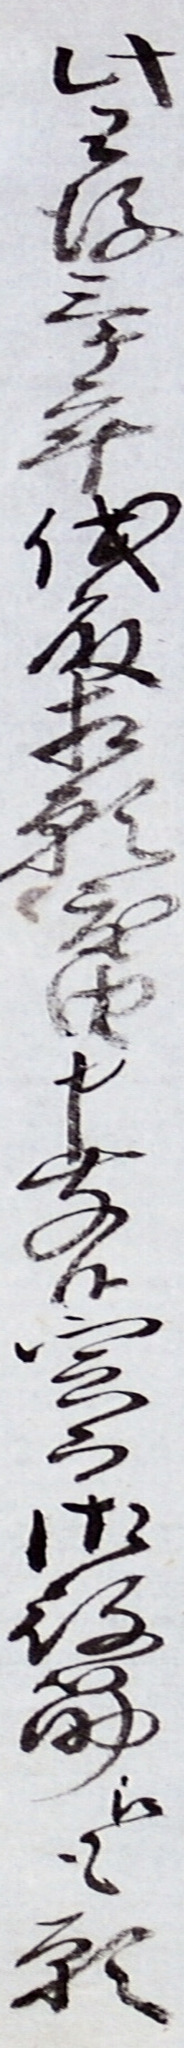此已後三ヶ年伐取相願度由申聞候定而御役筋江も願
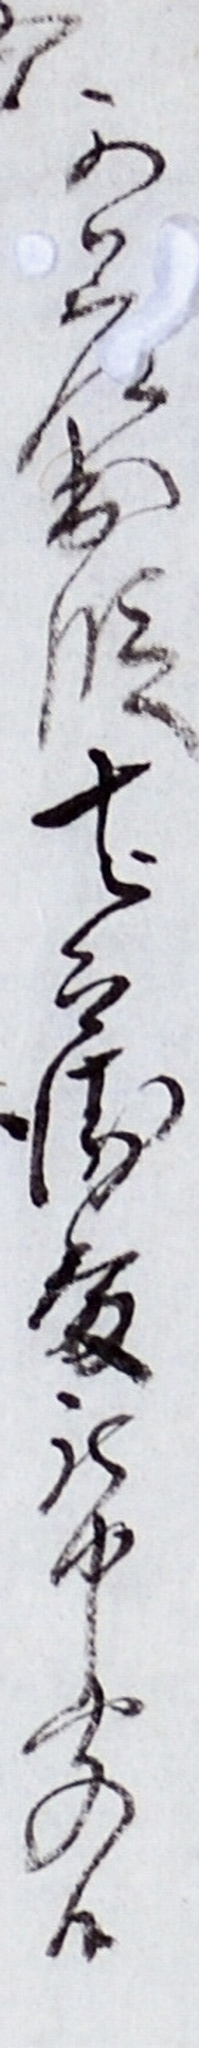可差出段十郎兵衛殿被申聞候
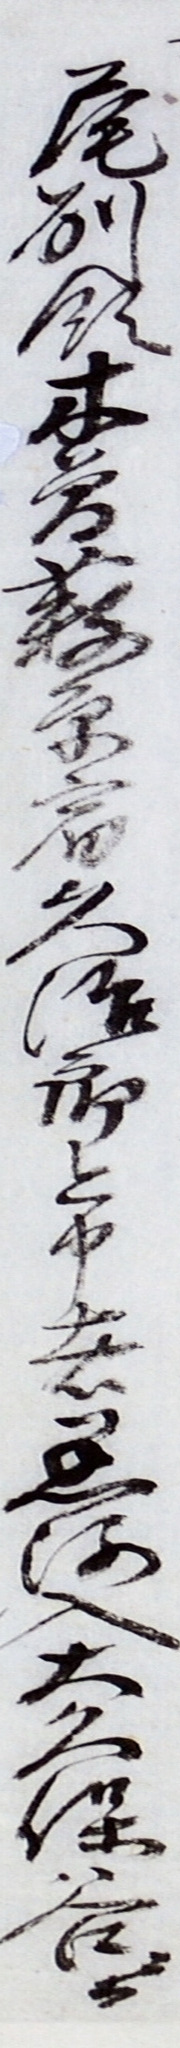一尾州領木曽薮原宿久治郎と申者黒河入大久保谷ニ而
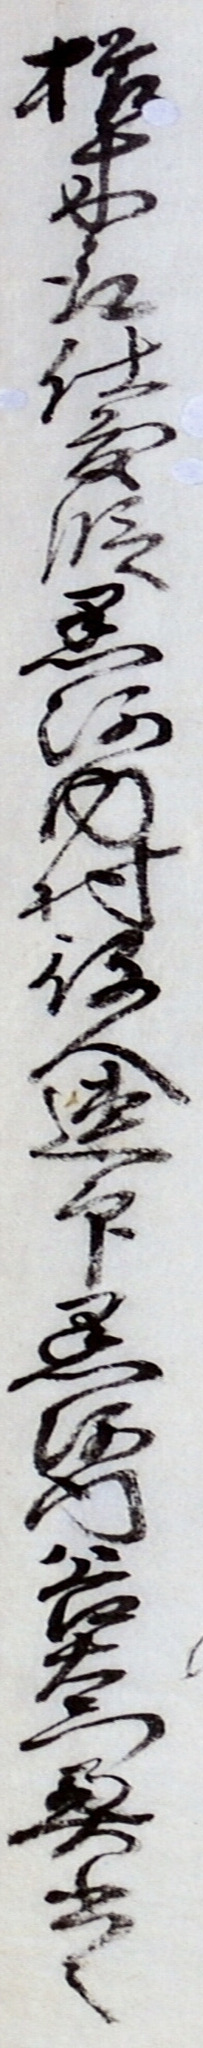枯木取仕度段黒河内村役人連印黒河内善右衛門奥書之
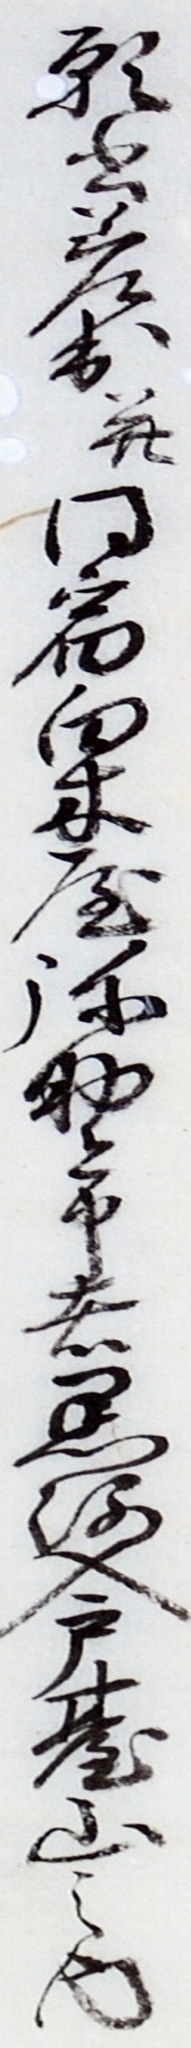願書差出并同宿白木屋弥助と申者黒河入戸台山之内
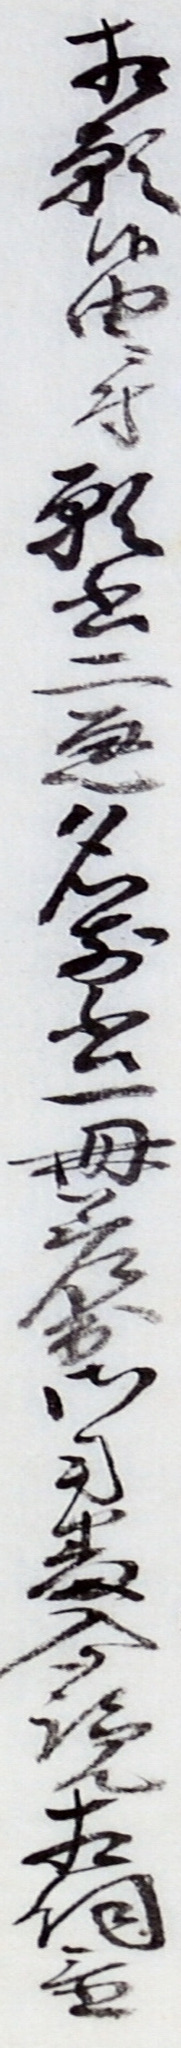相願候由ニ付願書二通名前書一冊差出御用番入り覧相伺置
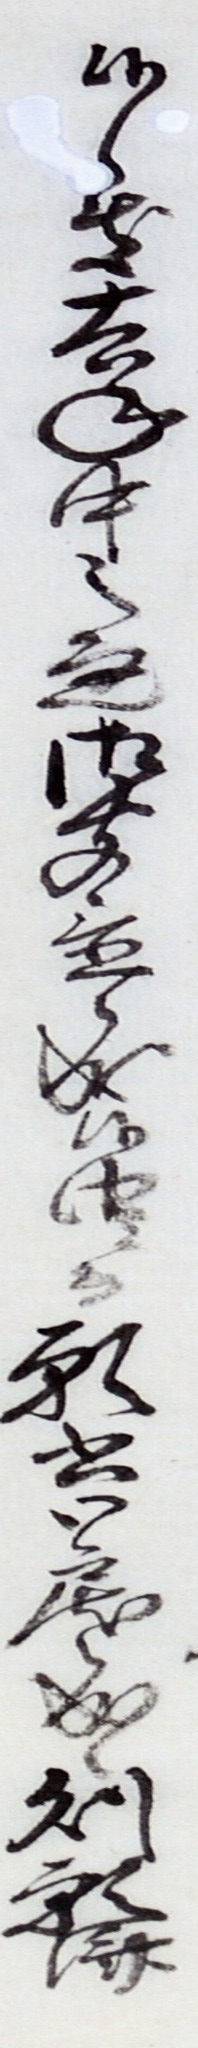候之処去年中之通御聞置被成候由ニ而願書御戻被成候則願済
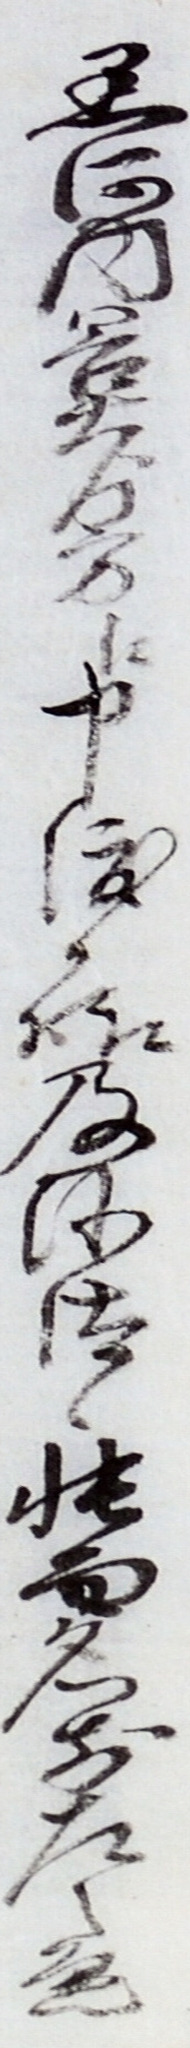黒河内善右衛門方江申渡候様及沙汰候帳面名前左之通
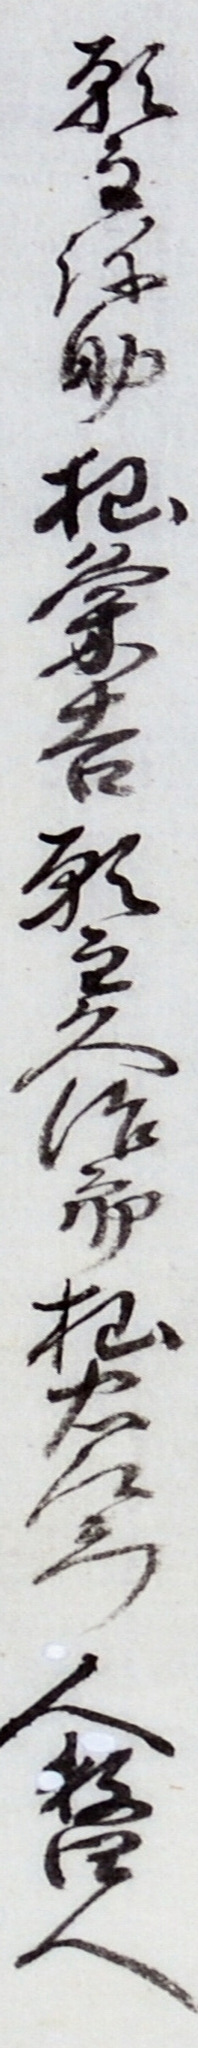願主弥助杣粂吉願主久治郎杣忠左衛門人数四人
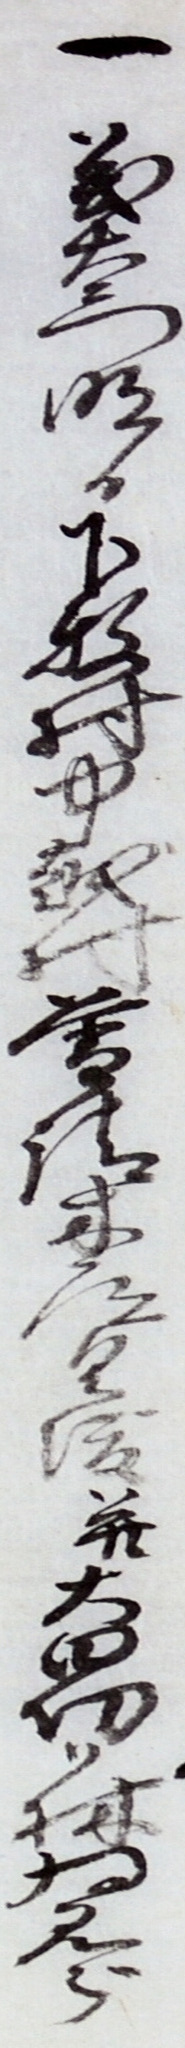一義右衛門明日下牧村中越村普請木道具渡并大田切御林為見分
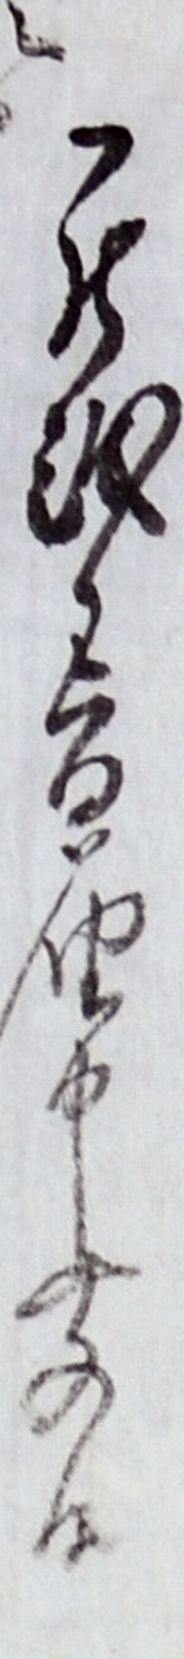罷越候旨届申聞候
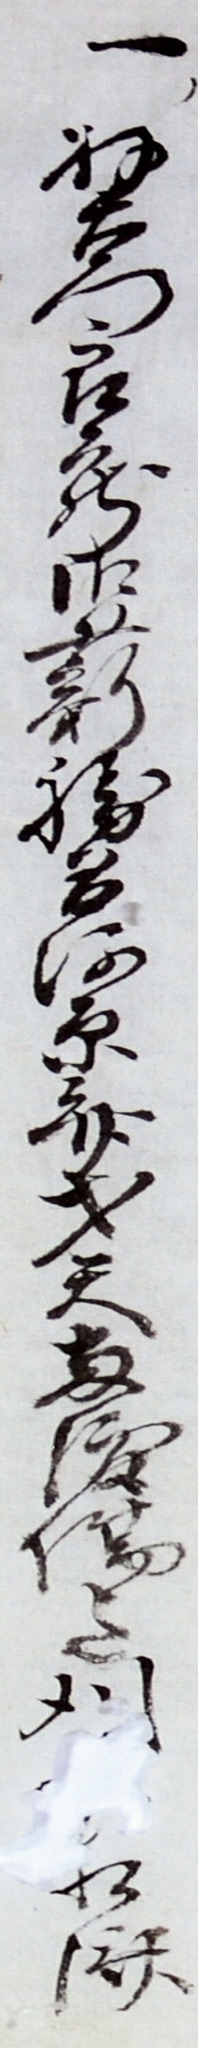一羽右衛門良蔵御薪勝間河原弁才天両渡場迄刈相済
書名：御山奉行御用控
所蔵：伊那市立高遠町図書館・合同会社AMANE
